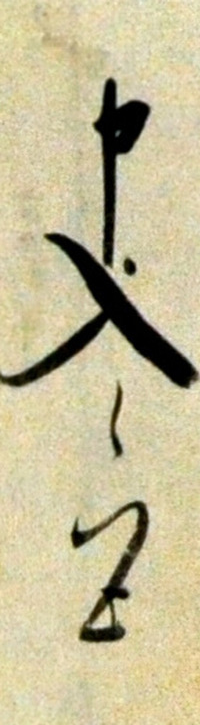申入候以上
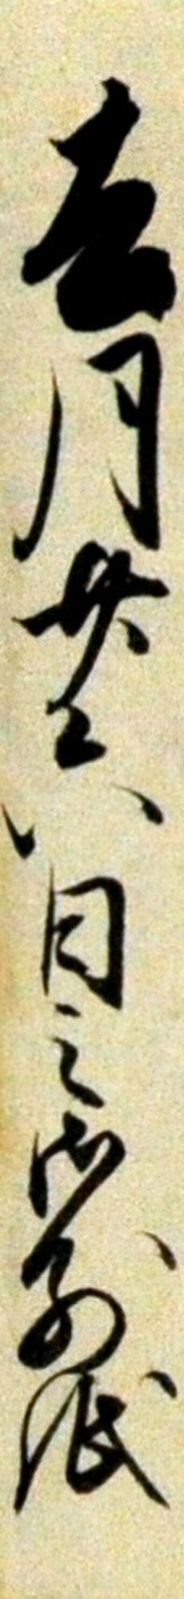去月廿六日之御別紙
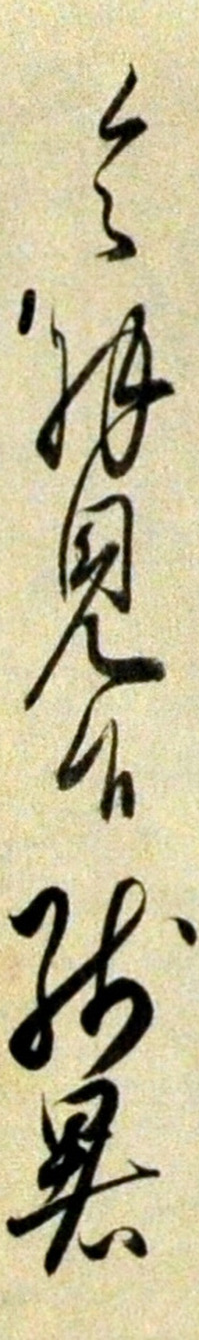令拝見候残暑
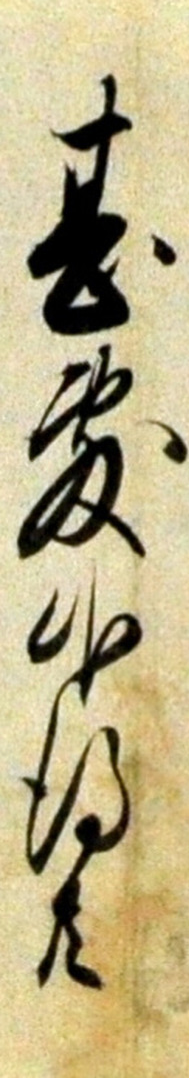甚敷候得共
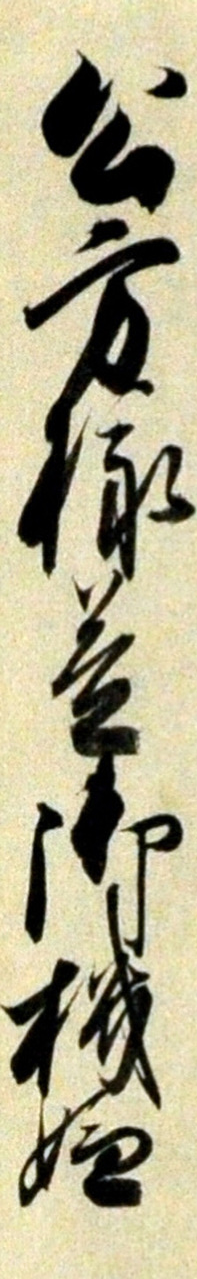公方様益御機嫌
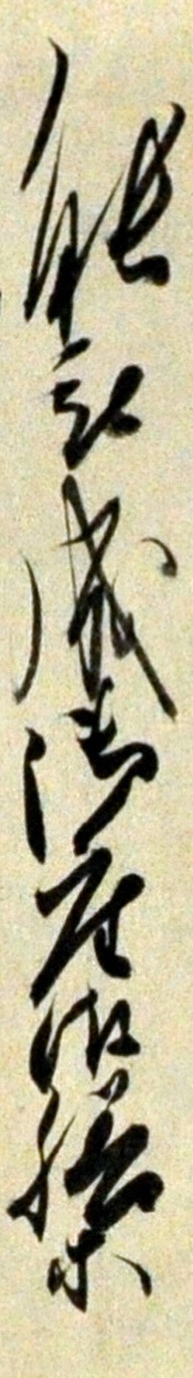能被成御座御膳等
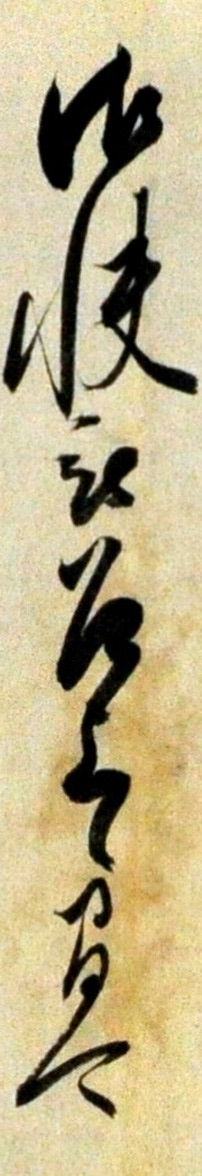御快被召上候間可
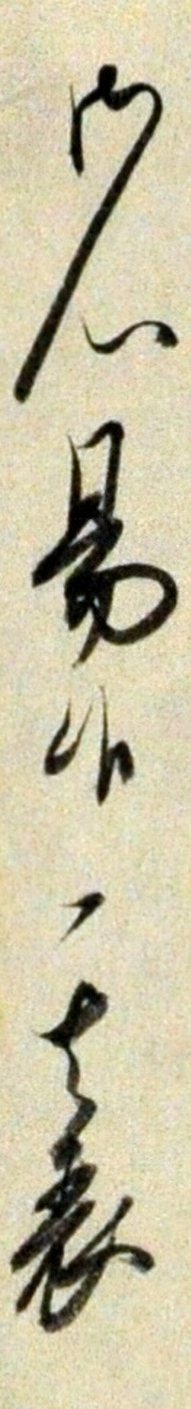御心易候其表
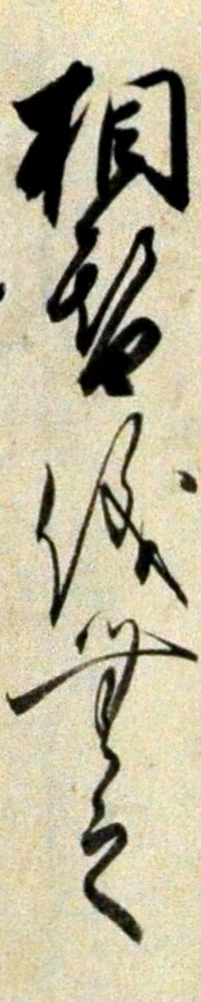相替儀無之
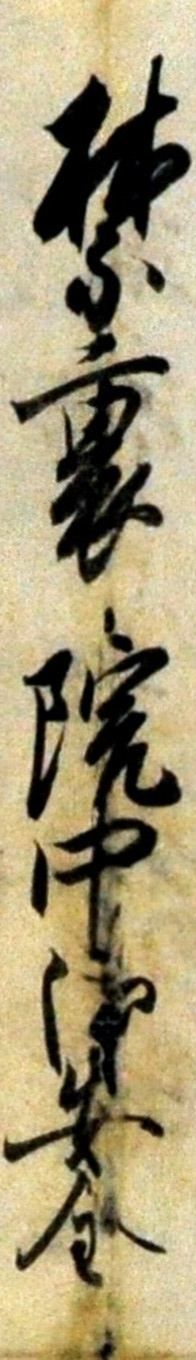禁裏院中御安全
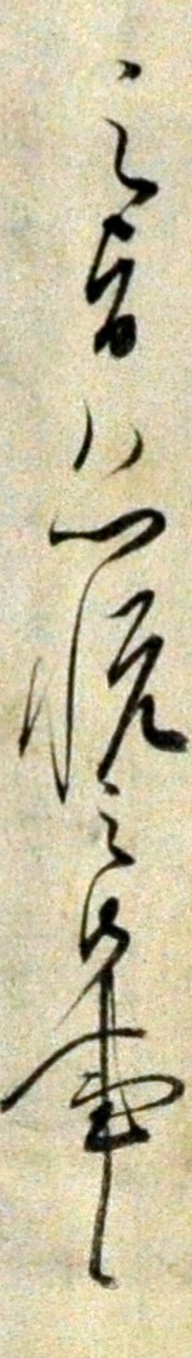之旨恐悦之御事候
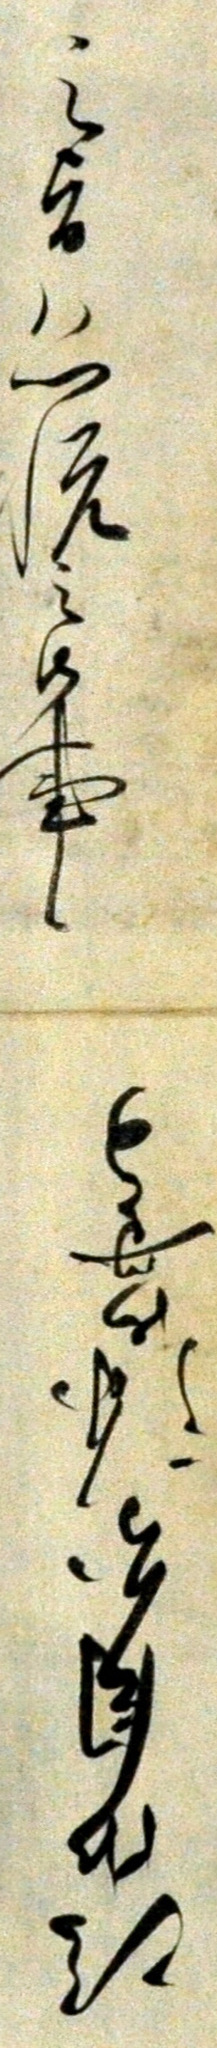之旨恐悦之御事候
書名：書状
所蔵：伊那市立高遠町図書館・合同会社AMANE
